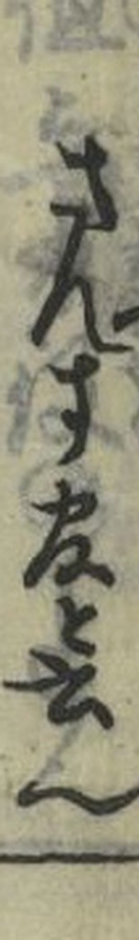さんす官と云
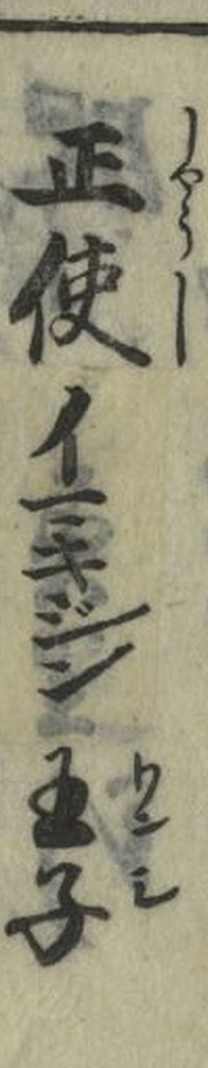正使イマキジン王子
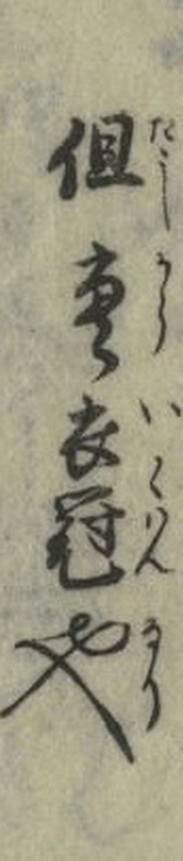但唐衣冠也
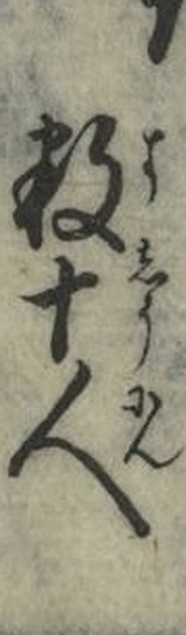数十人

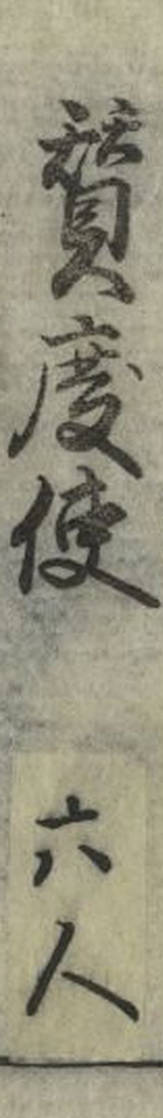賛度使六人
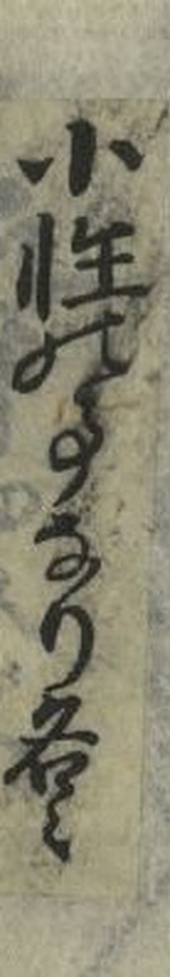小姓の事なり各々
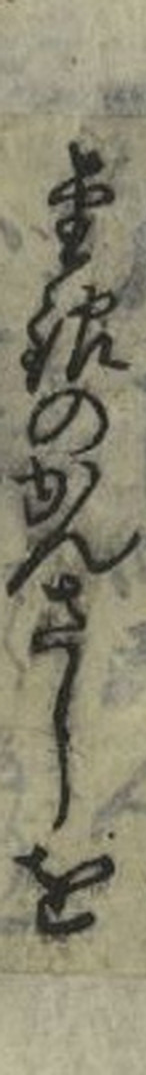重銀のかんさしを
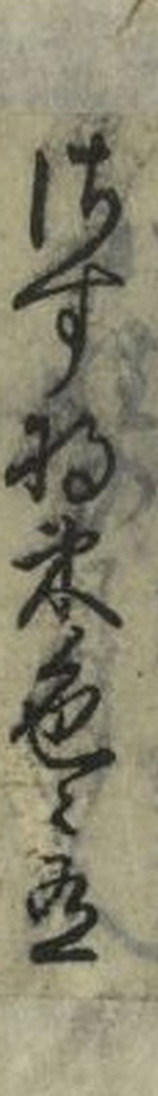さす持束色々有
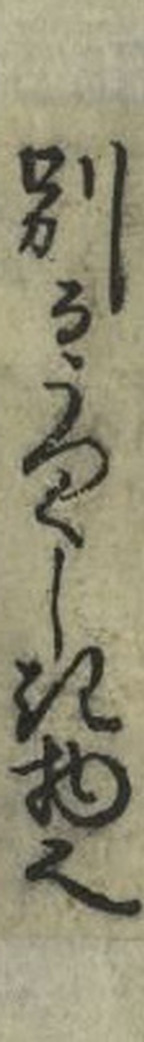別るうつくしき物也
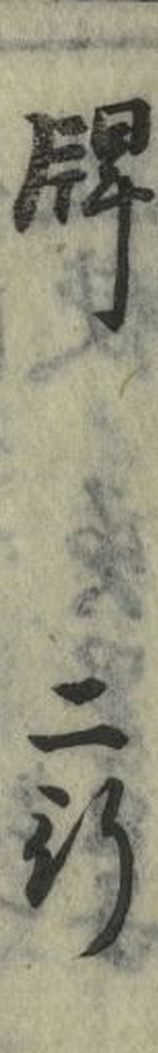牌二行
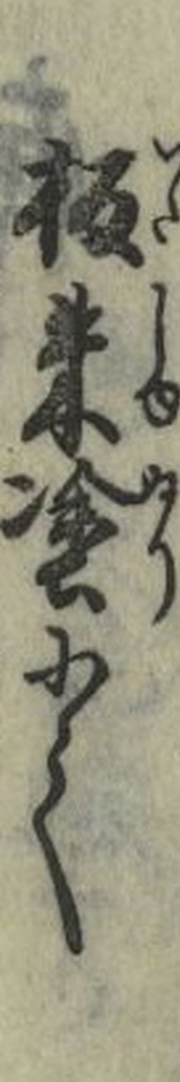板朱塗にて
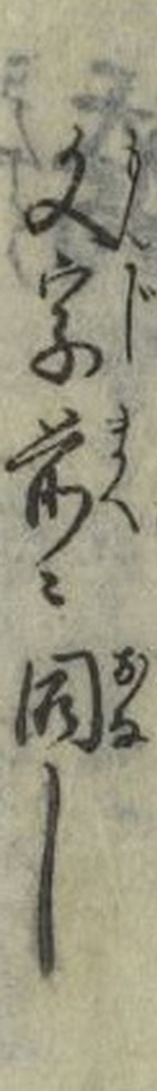文字前に同し
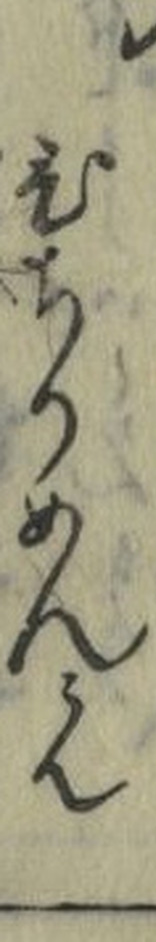ひちりめんは
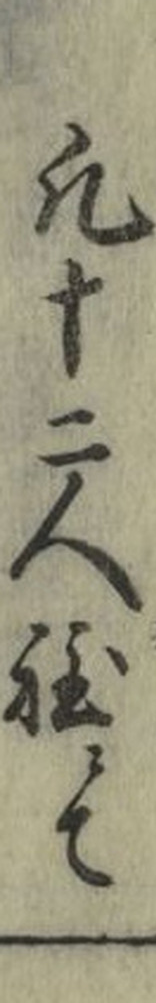凡十二人程にて

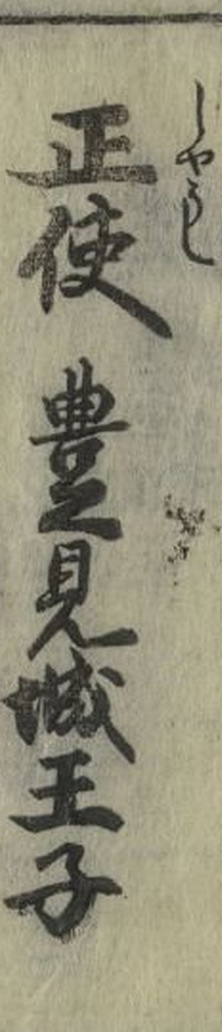正使豊見城王子
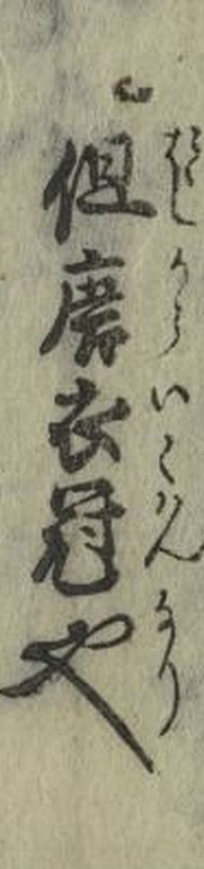但唐衣冠也
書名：琉球人大行列記
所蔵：University of the Ryukyus Library
